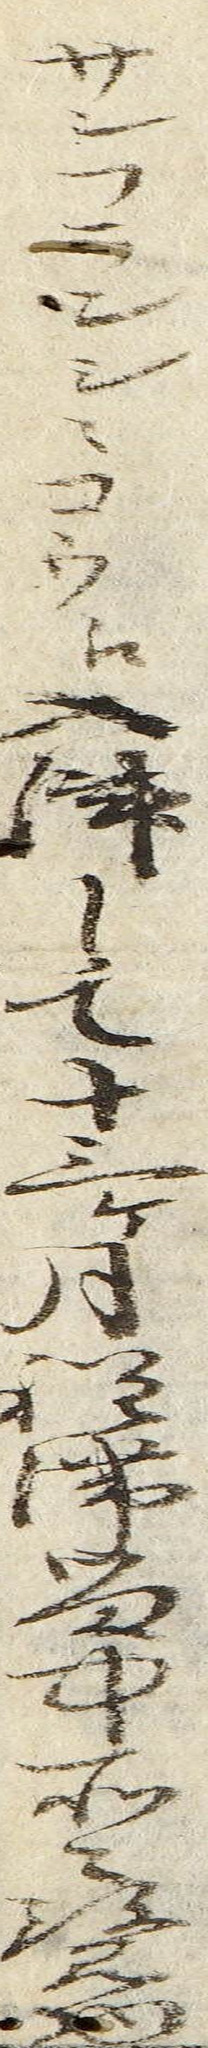サンフランシヽコウ江入津して十三ヶ月程滞留中所々致見物

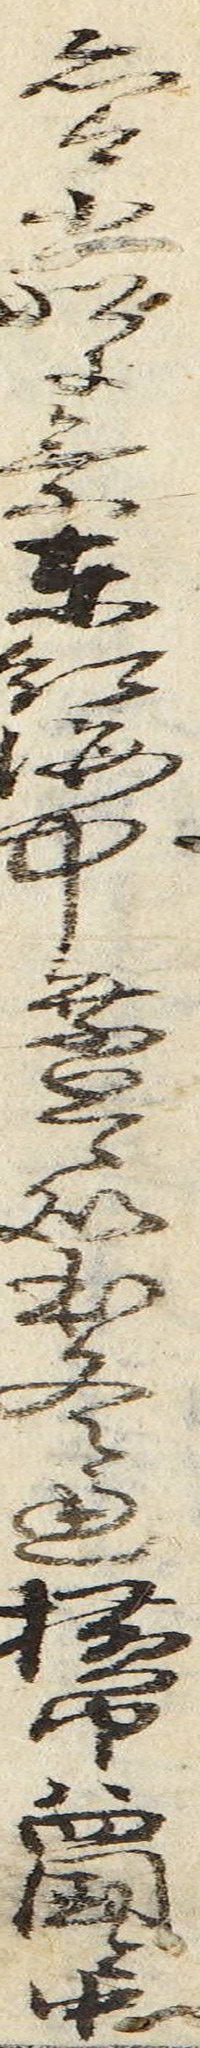亦は小船に乗東紅海中乗廻候処本文之通横巾は四国と中
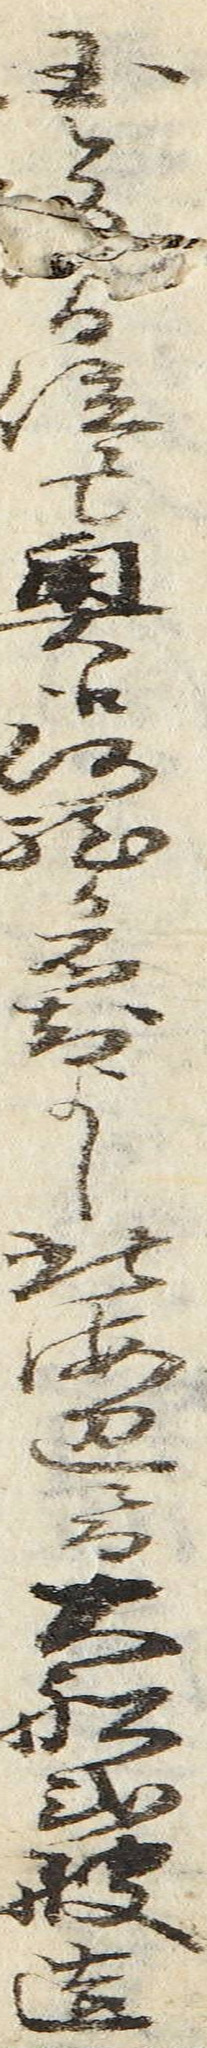国との間位にて奥江何程か不知よし此海辺に而大船弐艘造
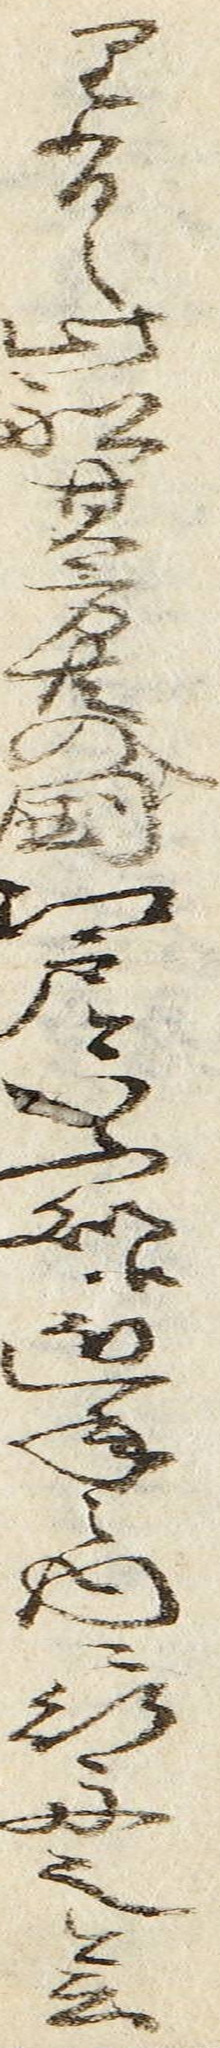り有之此船其方共の国江戸といふ処江近年之内に行舟也と云
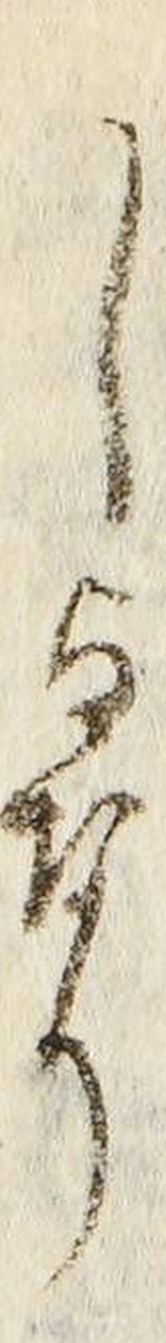しとなり
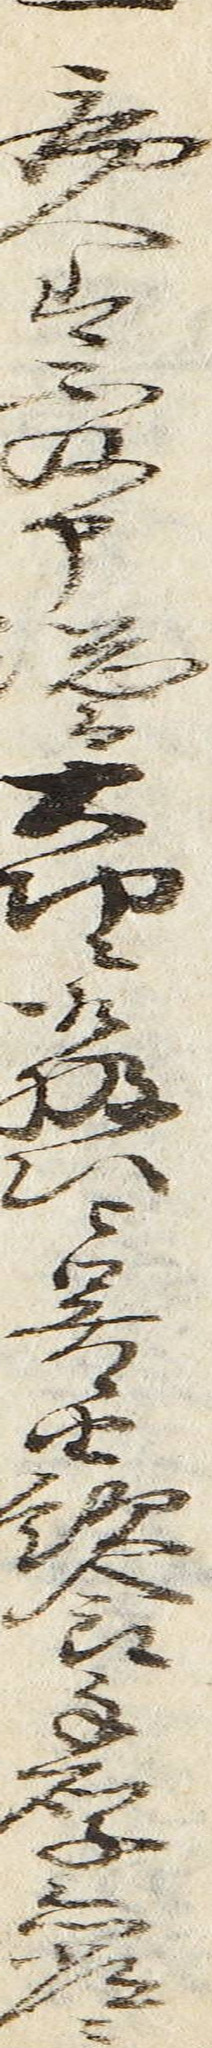一病人は不及申総而大切に取扱ひ被呉候由飲食手厚亦常々
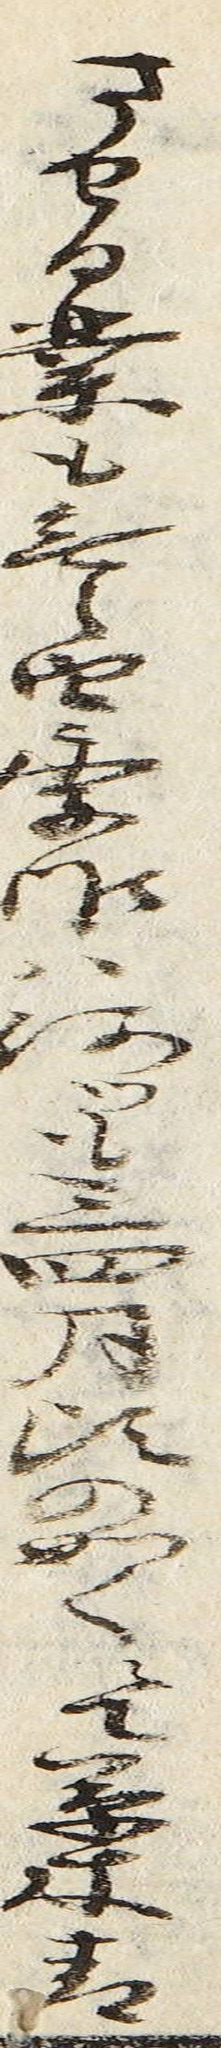させる業も無之由に季候は何つも三四月頃の如くにて草木青
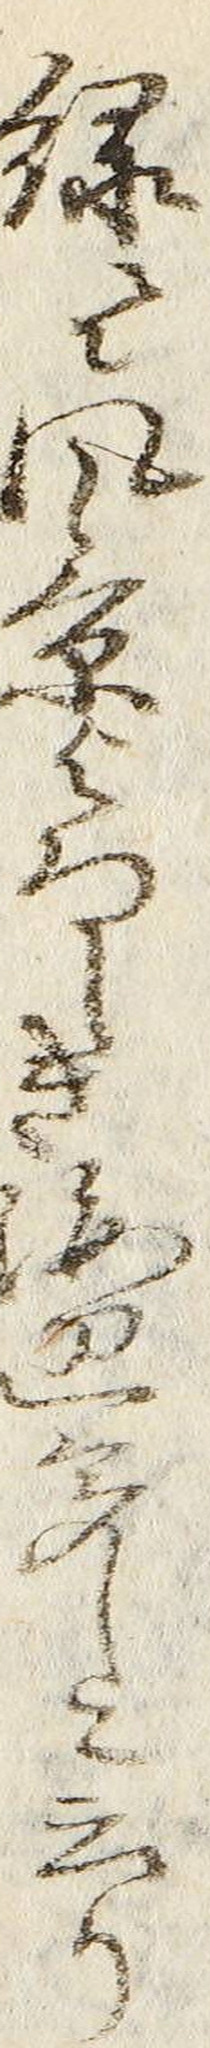緑にて風景よろしき海辺多しと云り
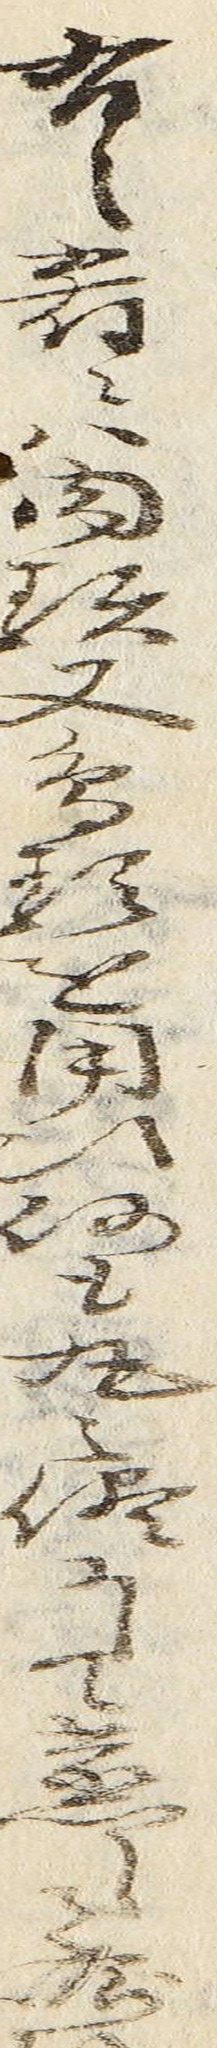有之肴には肉類又鳥類を用ひ何も丸之侭にして蒸して喰ひ
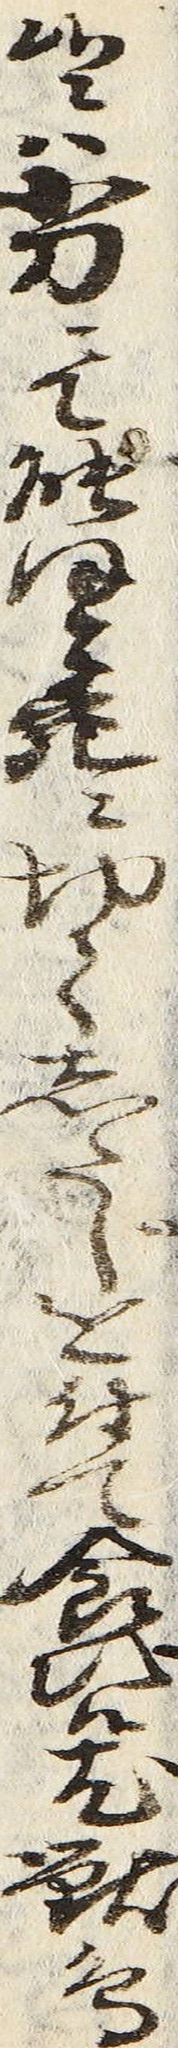候には小刀にて能ほと宛に切てしたじを付て食ひ候尤獣鳥
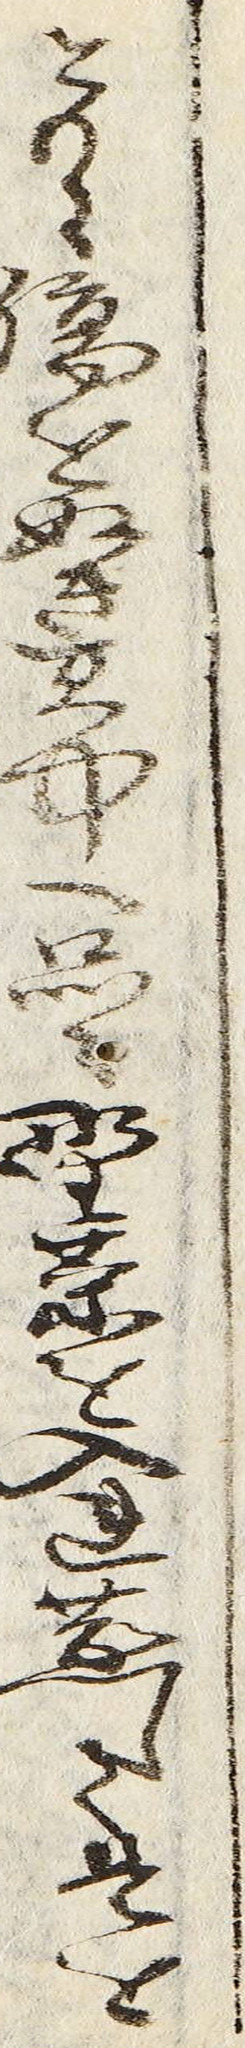ともに腹をぬき其中へ品々野菜を入れ蒸して是を
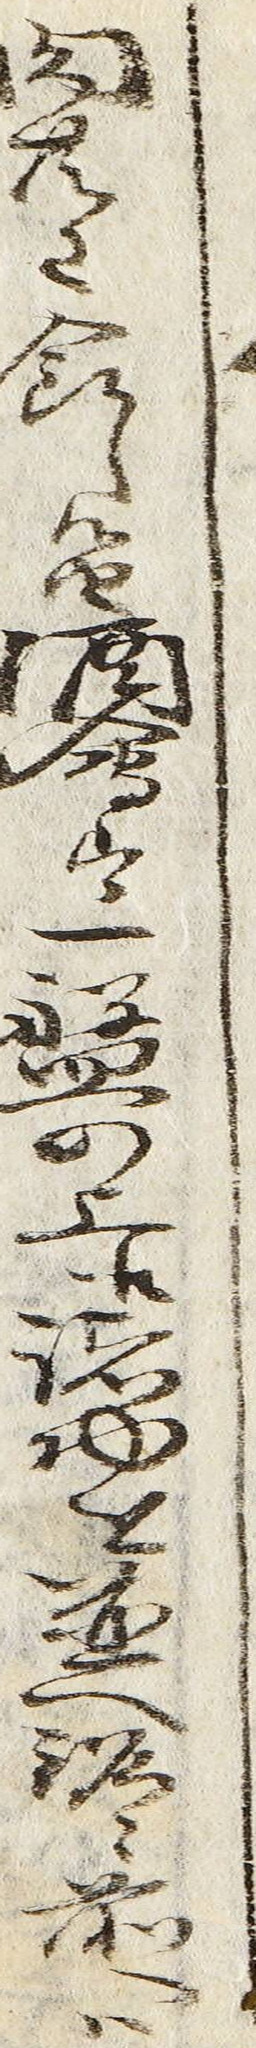肉共に食し候由酒会は一盤の上江諸物を並へ銘々前へは
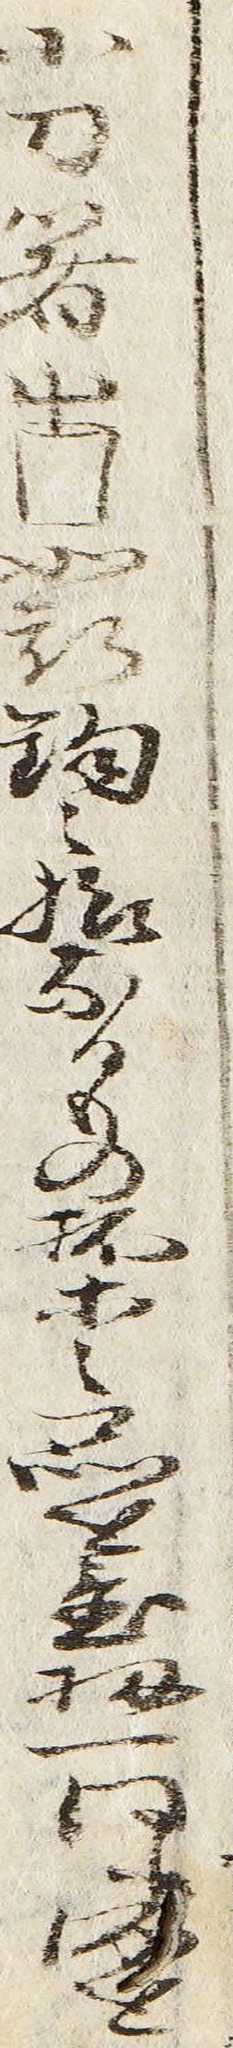小刀箸如斯鉤之様なるもの杯等の品を置扨一同江酒を
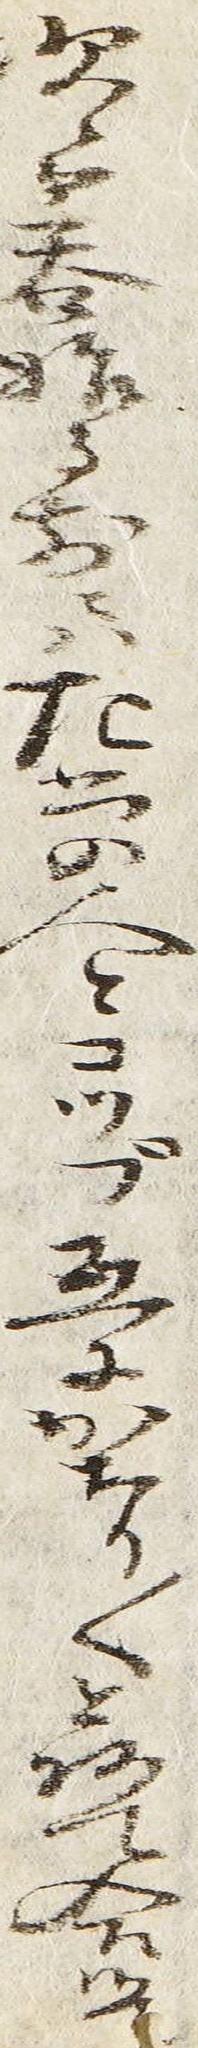次候而呑始る前には左右の人とコップ互にかちり〳〵とあて合候て
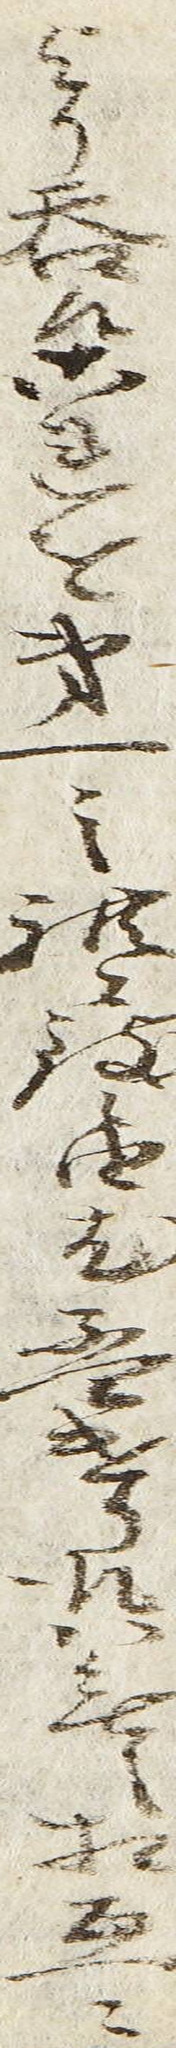より呑候これを第一之礼に致候由尤盃遣り取は無之相互に
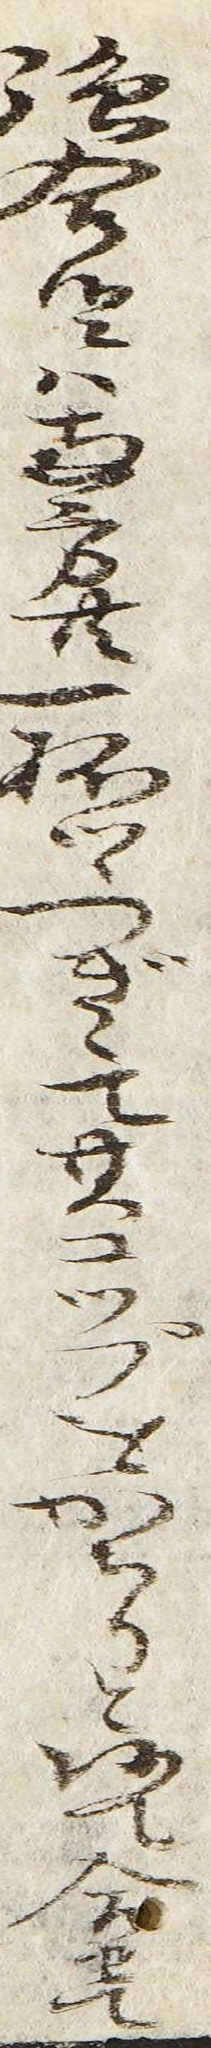強合候には当方共一杯つゝつぎ候て其コップをかちりとあて合せて
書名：漂流夢物語
